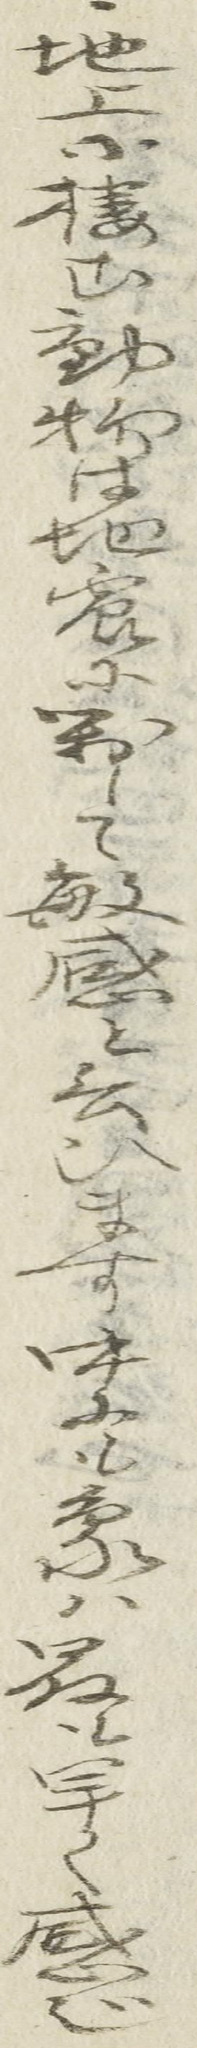一地上に棲む動物は地震に対して敏感と云ひます中にも象は最も早く感じ
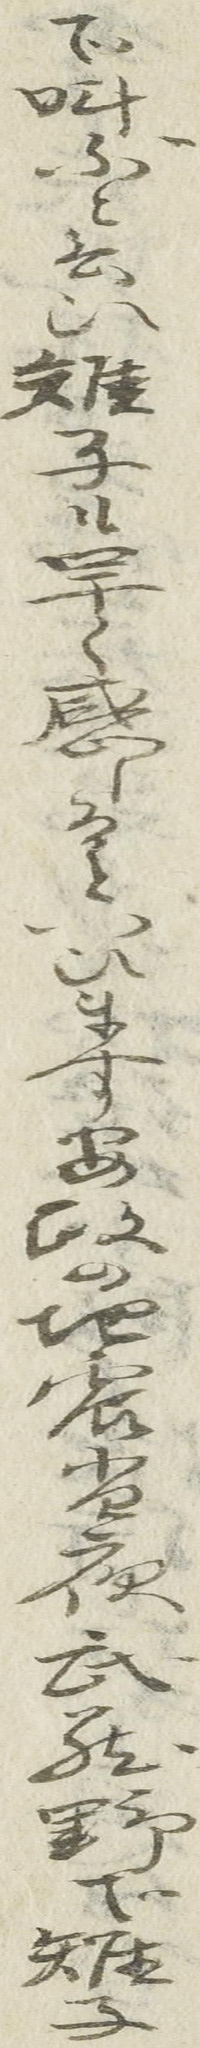て叫ぶと云ひ雉子も早く感しるといひます安政の地震当夜武蔵野で雉子
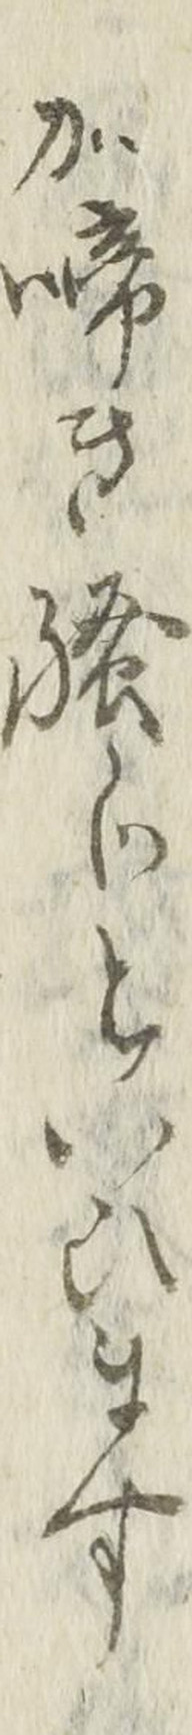が啼き騒ぐといひます
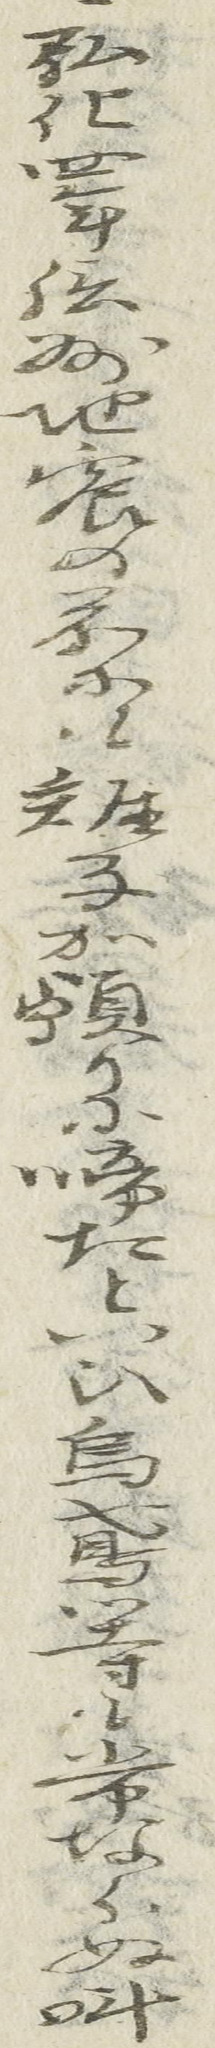一弘化四年信州地震の前にも雉子が頻りに啼たといひ烏鳶等も常ならぬ叫
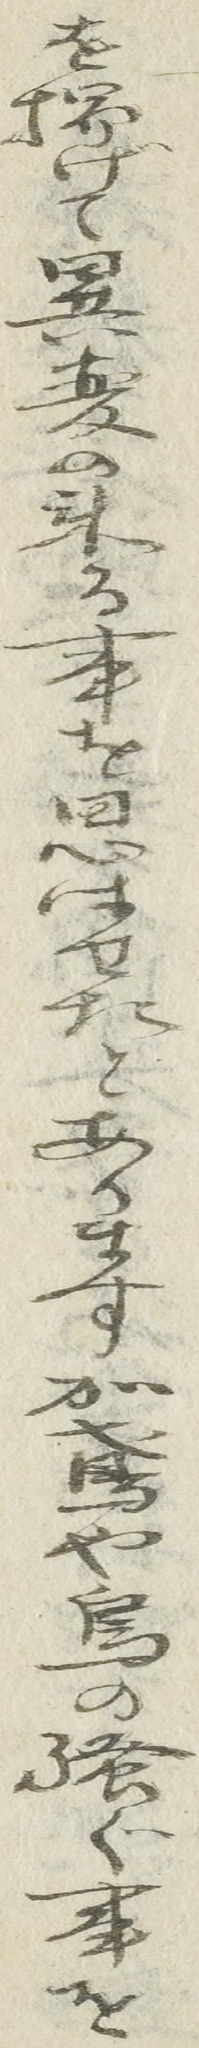を揚げて異変の来る事を思はせたとありますが鳶や烏の騒ぐ事を
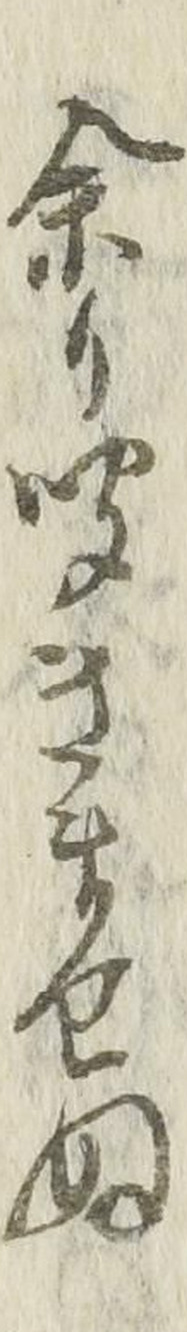余り聞きませぬ
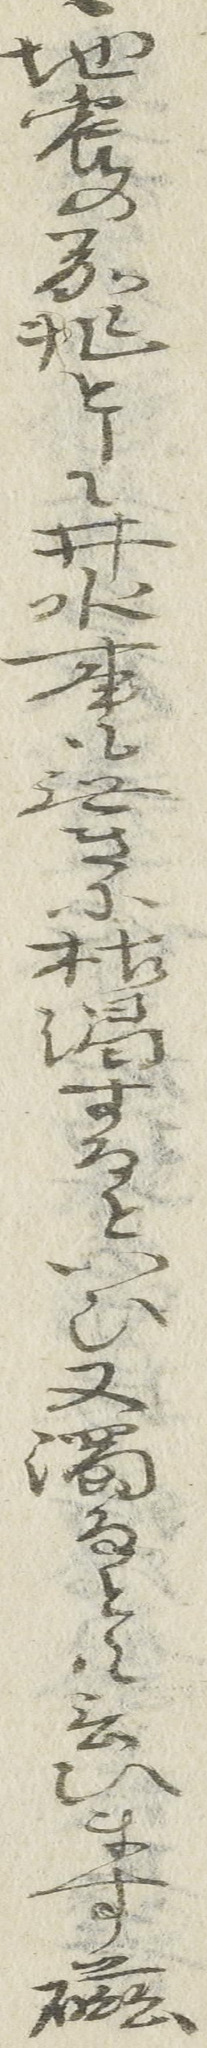一地震の前兆として井水事も無きに枯渇するといひ又濁るとも云ひます磁
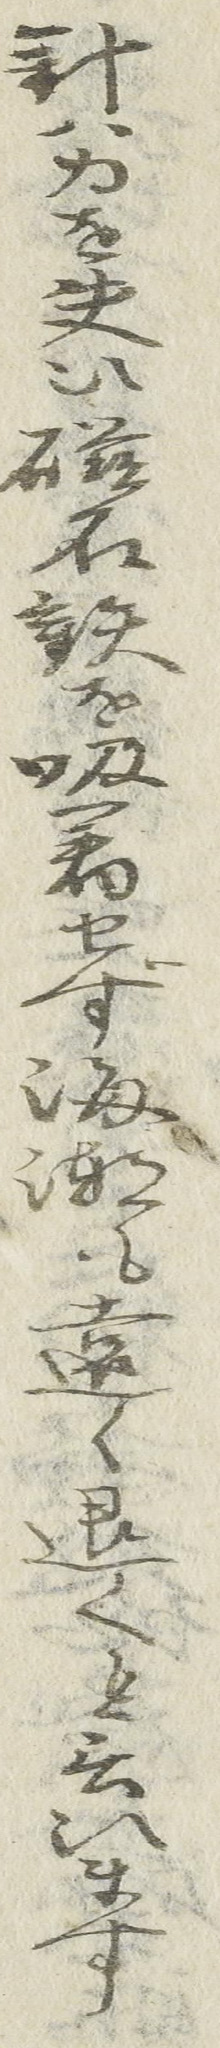針は力を失ひ磁石鉄を吸着せず海潮も遠く退くと云ひます
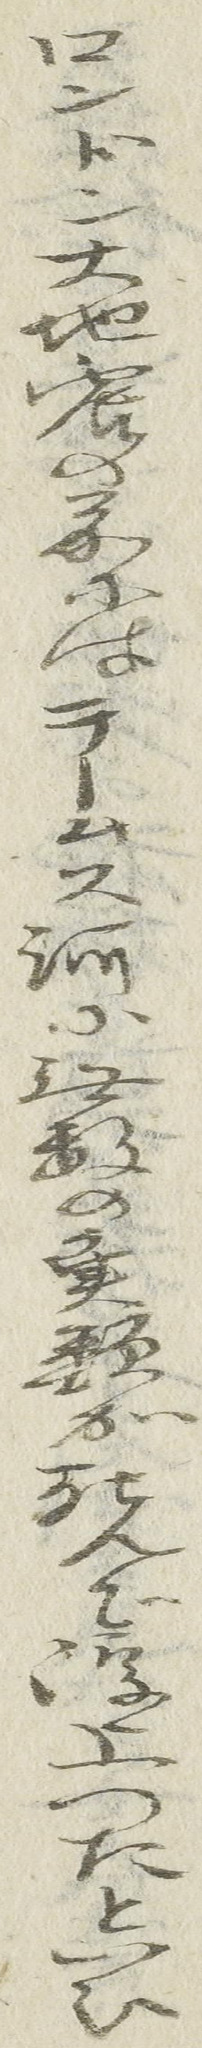一ロンドン大地震の前にはテームス河に無数の魚類が死んで浮上つたといひ
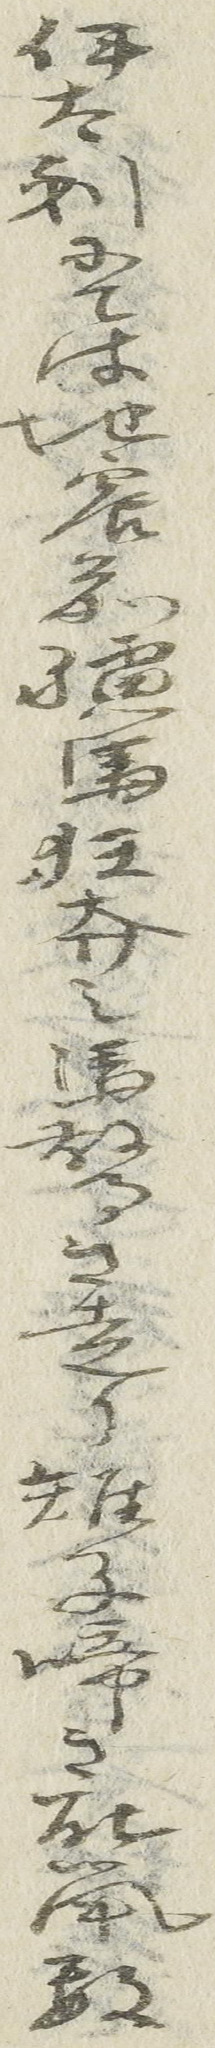伊太利にては地震前驢馬狂奔し馬驚き走り雉子啼き死鼠数
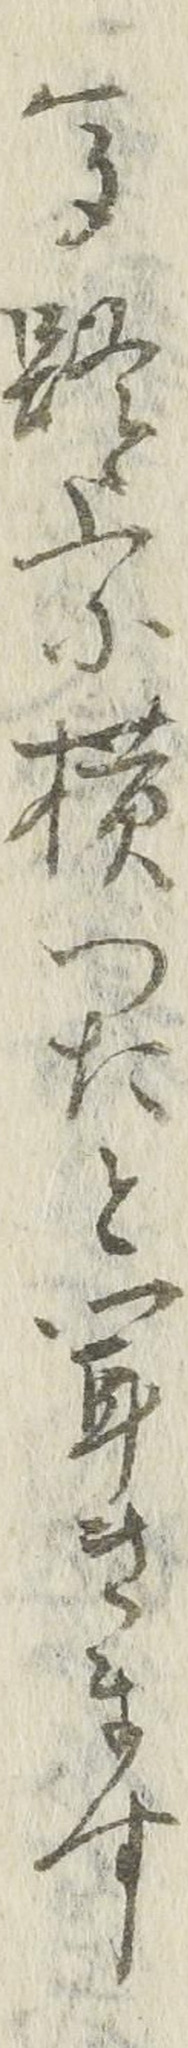多路上に横つたと聞きます
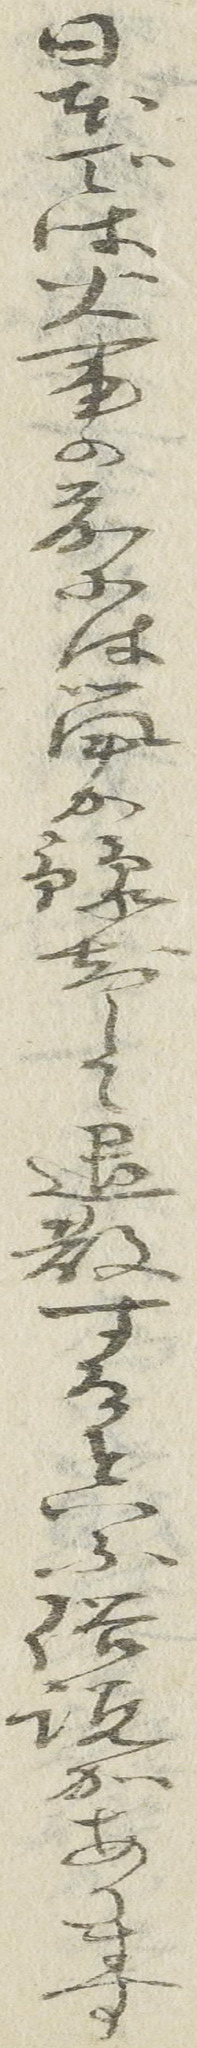一日本では火事の前には鼠か豫知して退散するといふ伝説があります

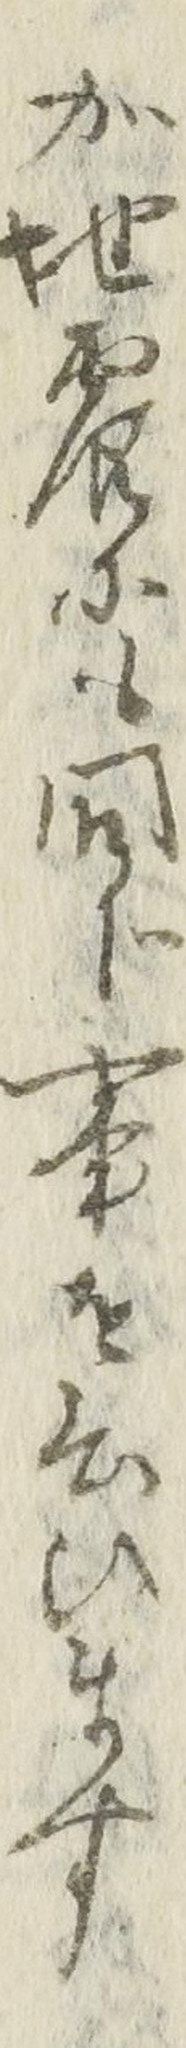が地震にも同じ事を云ひます
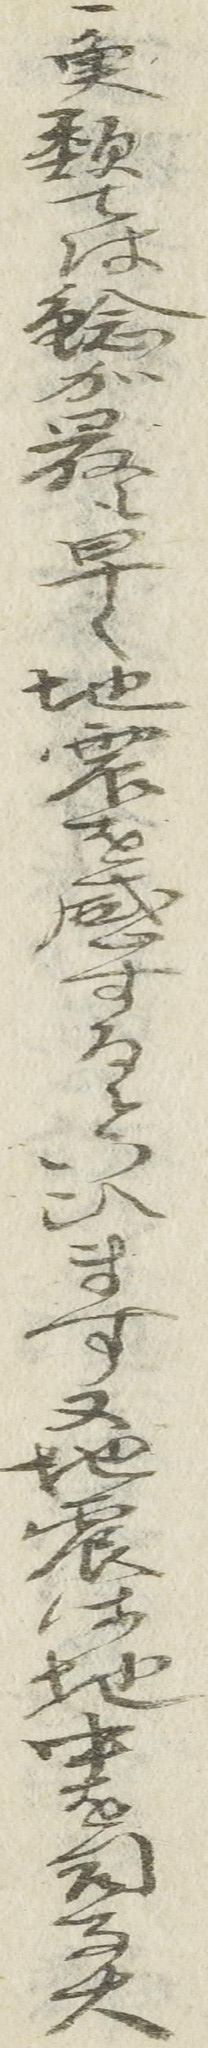一魚類ては鯰が最も早く地震を感するといひます又地震は地中を司る大
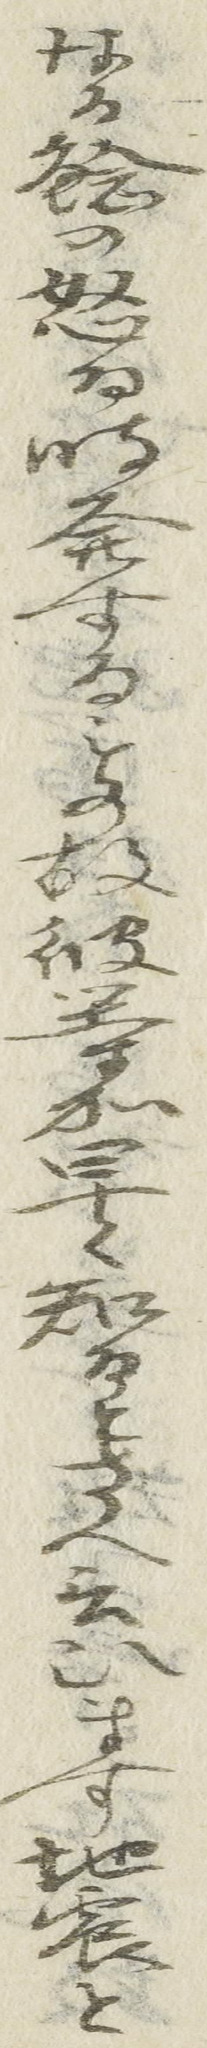なる鯰の怒るとき発するもの故彼等が早く知るとさへ云ひます地震と
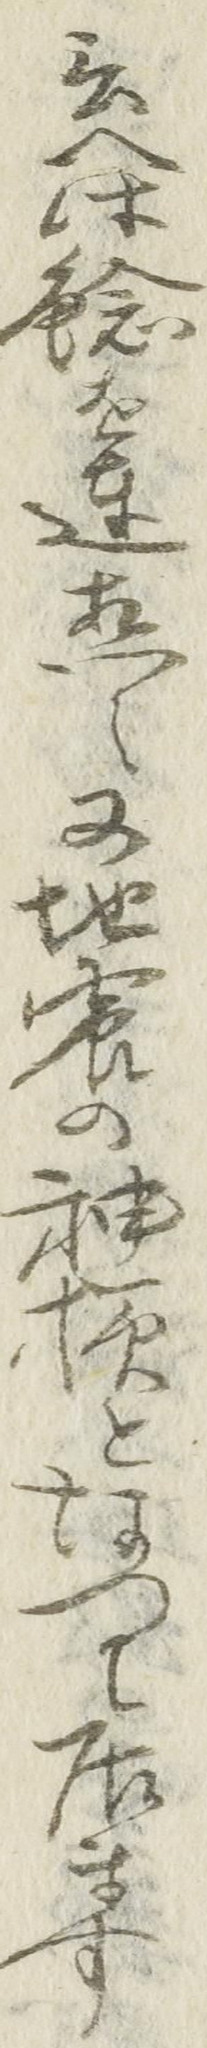云へば鯰を連想し又地震の神様となつて居ます
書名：地震前兆集　全
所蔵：東京大学地震研究所図書室 Earthquake Research Institute Library, The University of Tokyo, JAPAN
